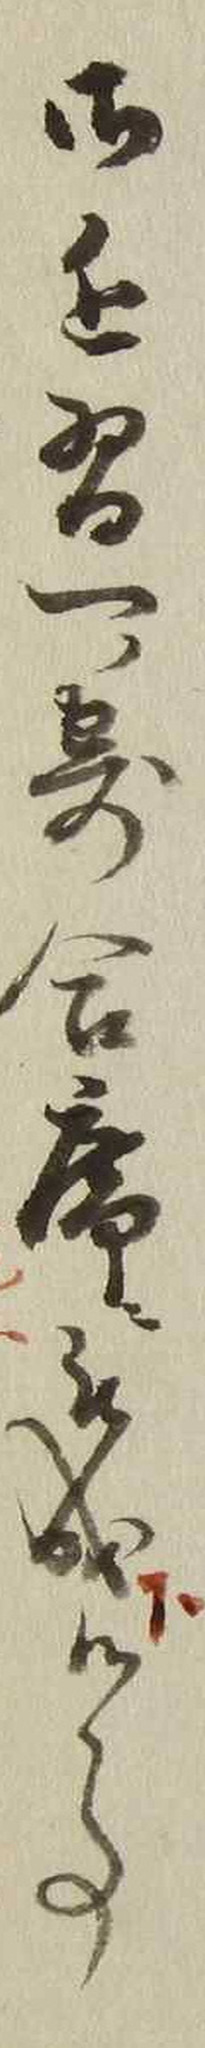御近習一ノ寄合席ニ被成下候事
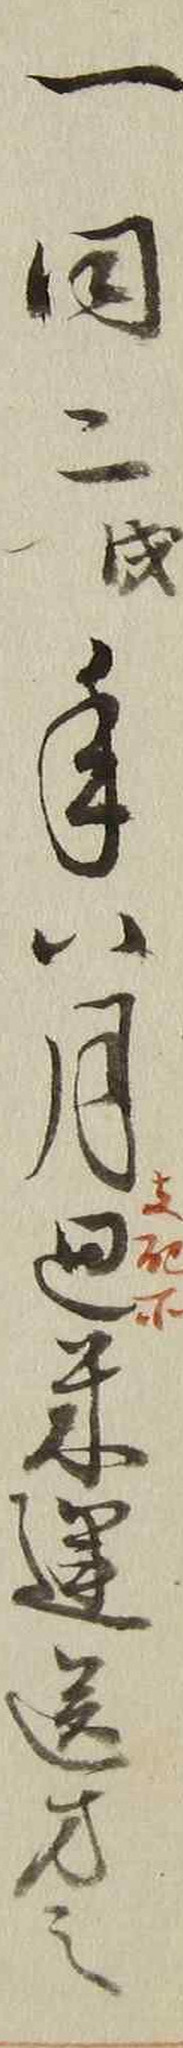一同二戌年八月廻米運送方之
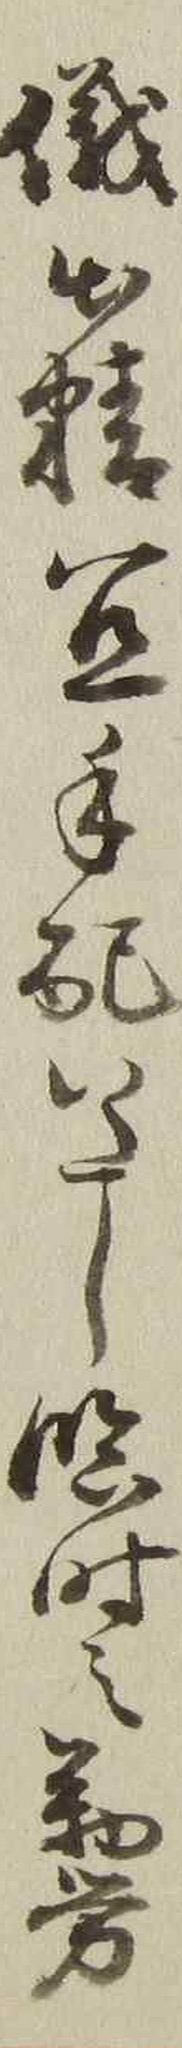儀出精宜手配いたし臨時之勤労
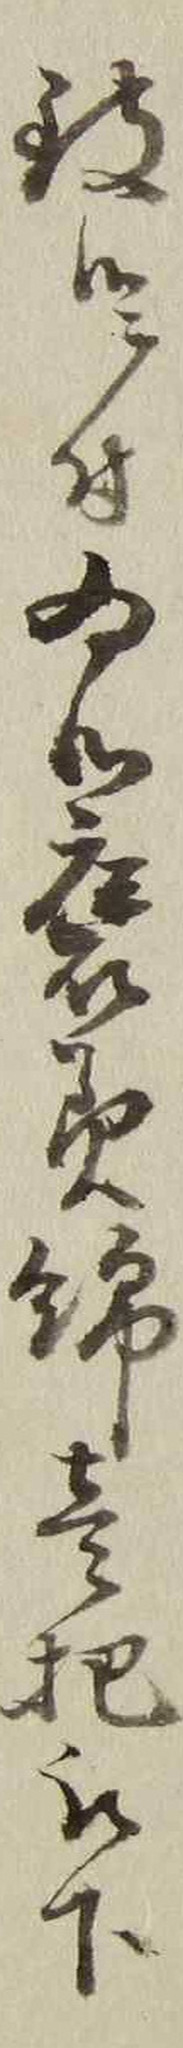致候ニ付為御褒美綿壱把被下
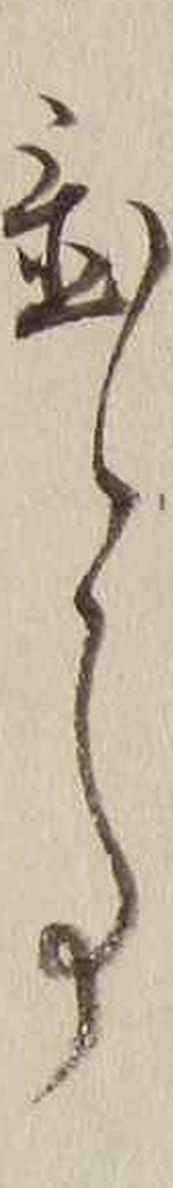置候事
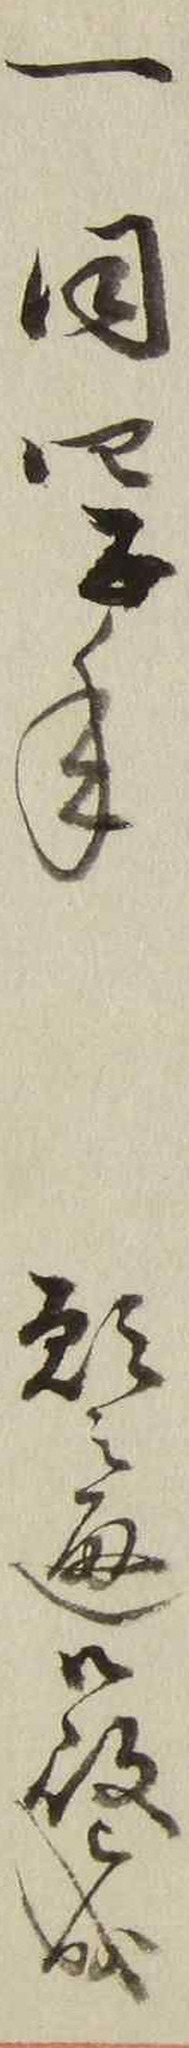一同四子年願之通御役被成
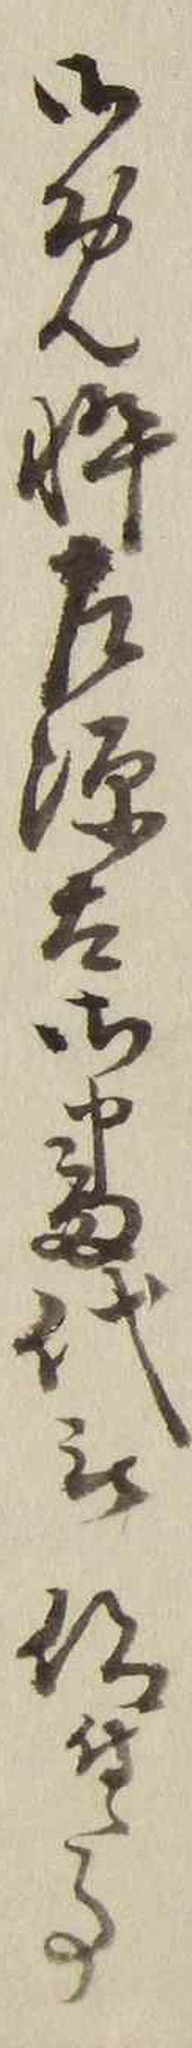御免忰左源太御番代被仰付候事

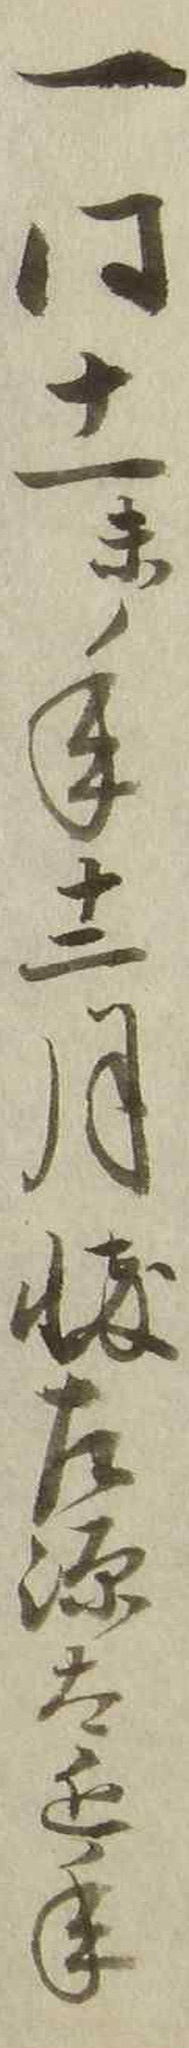一同十一未年十二月忰左源太近年
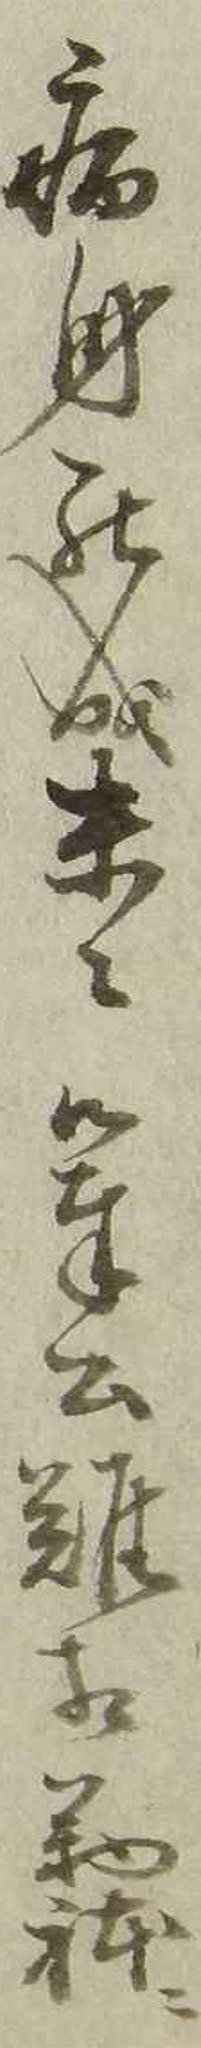病身罷成末々御奉公難相勤躰ニ
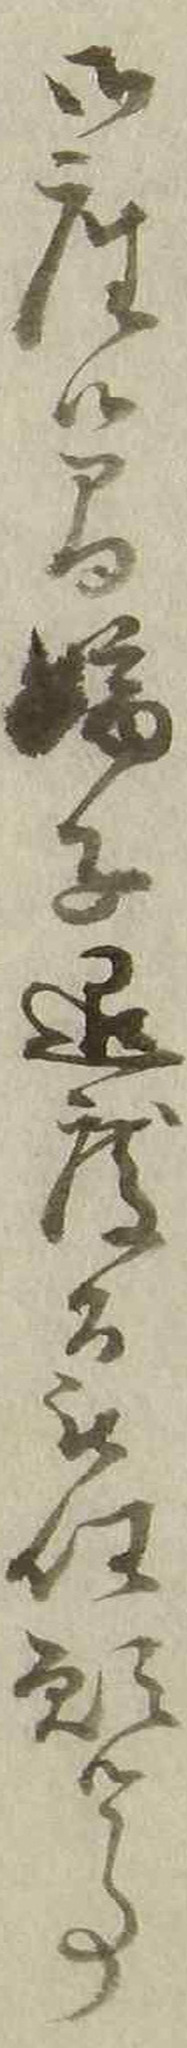御座候間嫡子退度旨被任願候事
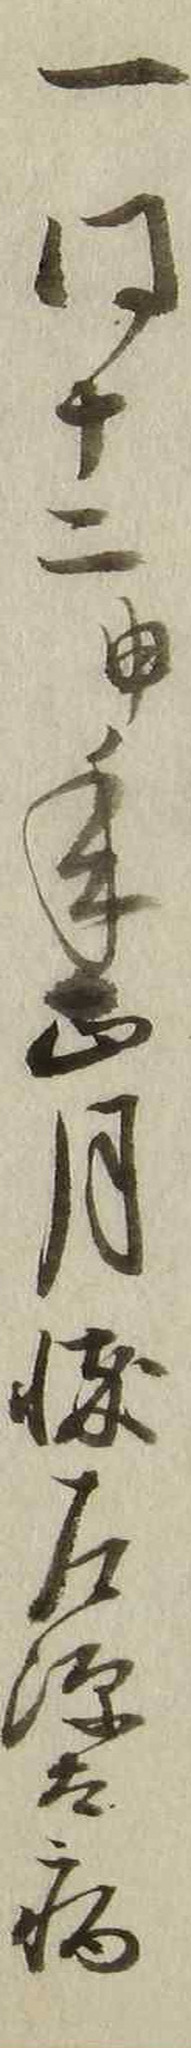一同十二申年正月忰左源太病
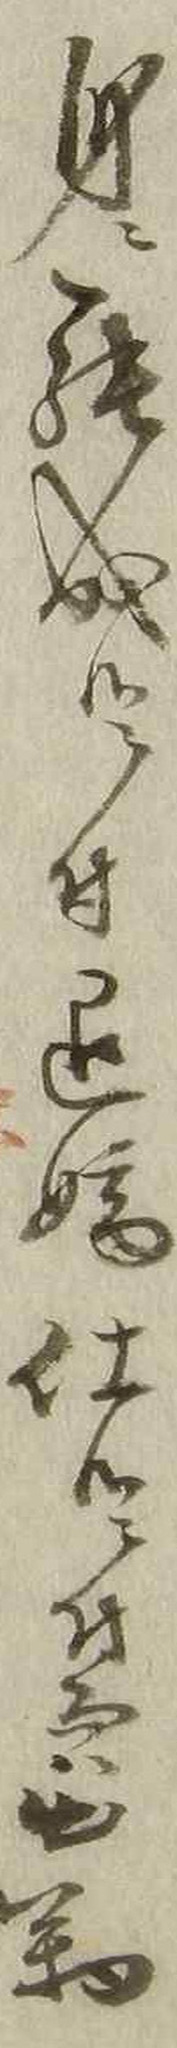身ニ罷成候ニ付退嫡仕候ニ付而ハ出勤
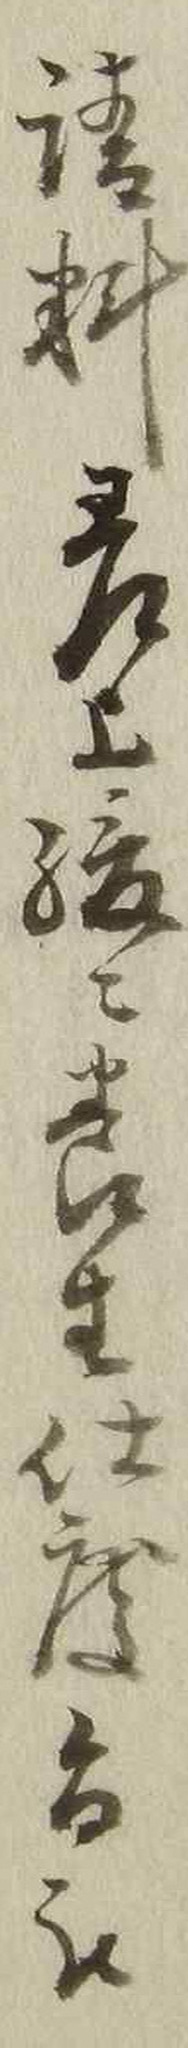請料差上緩々養生仕度旨被
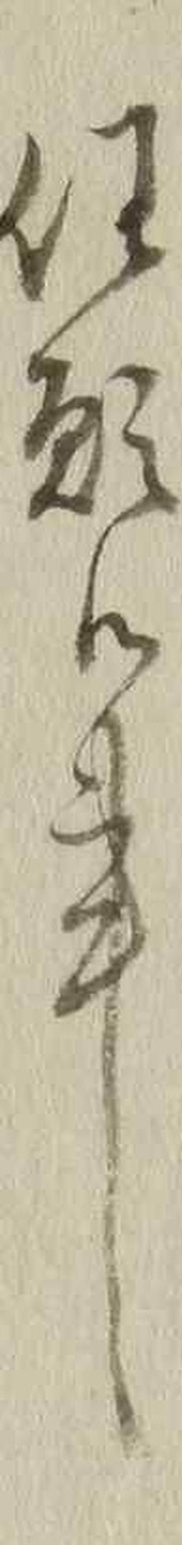任願候事
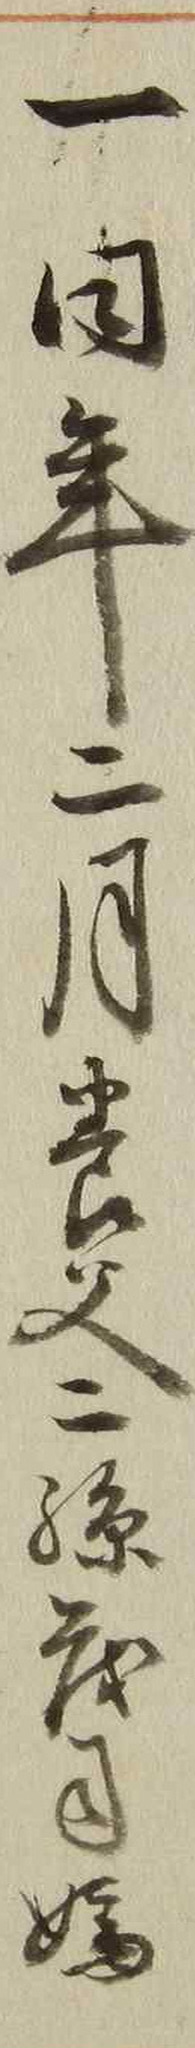一同年二月養父ニ孫茂司嫡
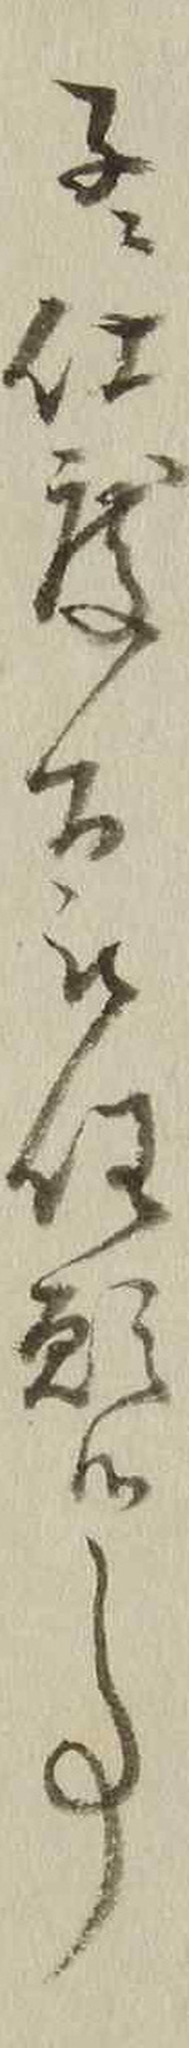子ニ仕度旨被任願候事
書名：諸士系譜　巻之53　に之部4
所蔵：会津若松市立会津図書館
